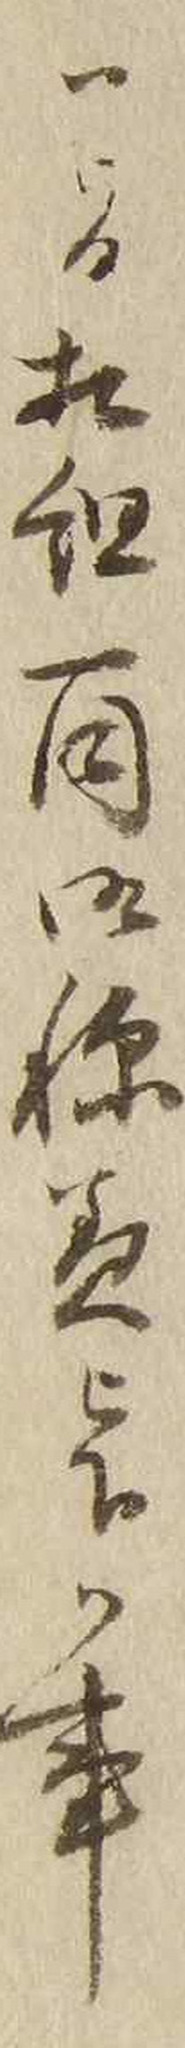候旨相組一同御称美被下候事

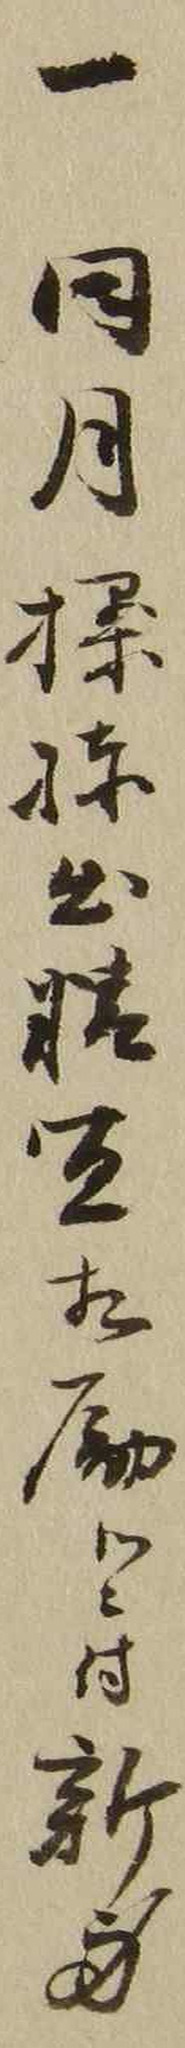一同月操練出精宜相励候ニ付新身
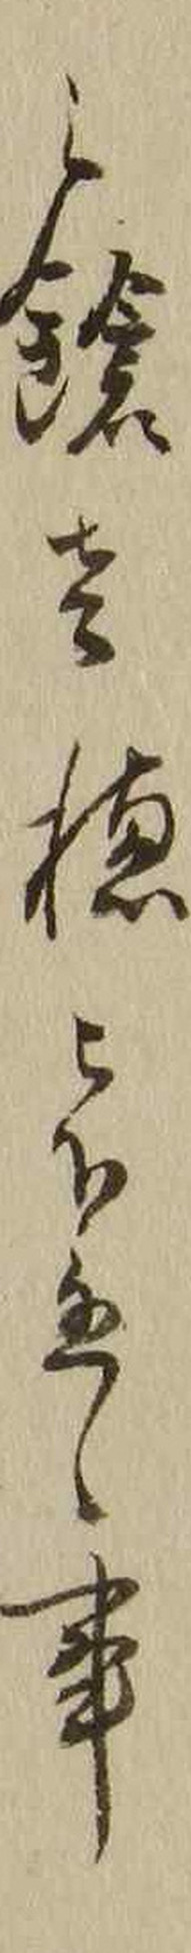之鎗壱穂被下置候事
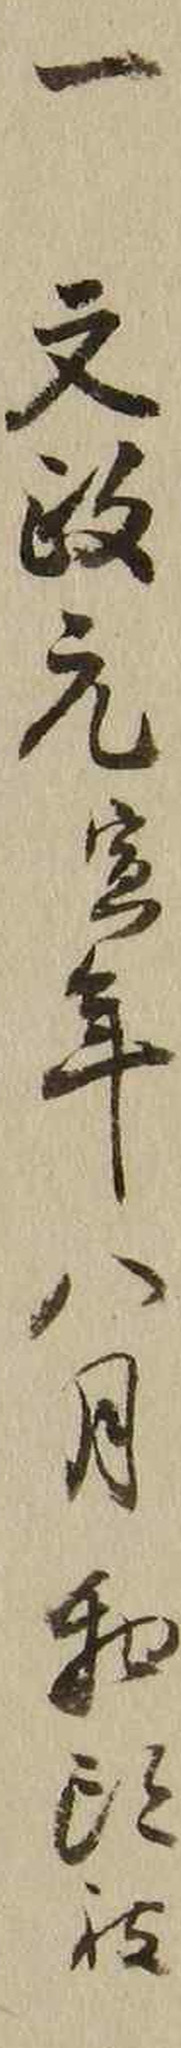一文政元寅年八月物頭被
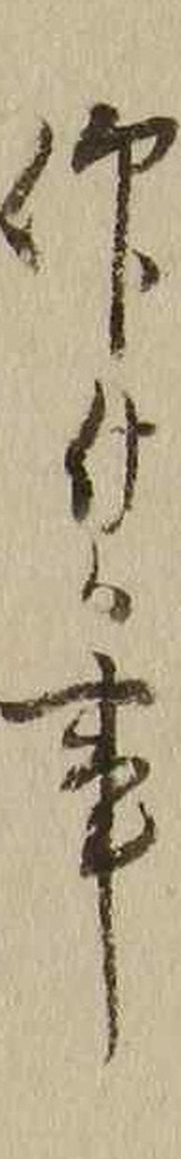仰付候事
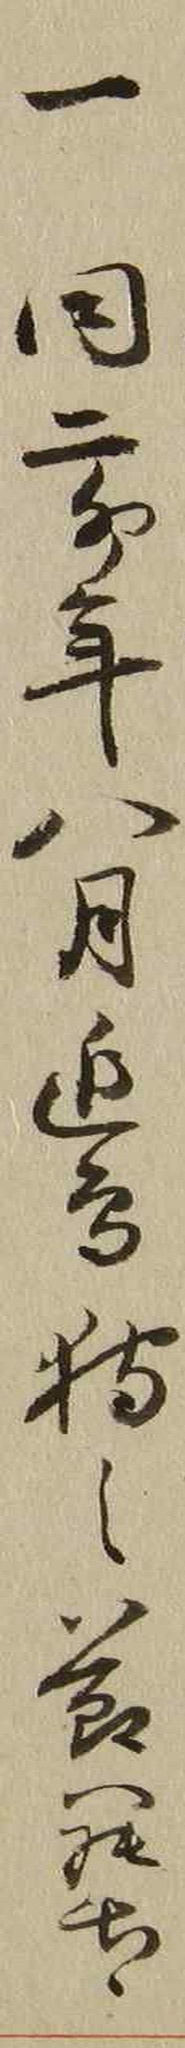一同二卯年八月追鳥狩之節罷出候
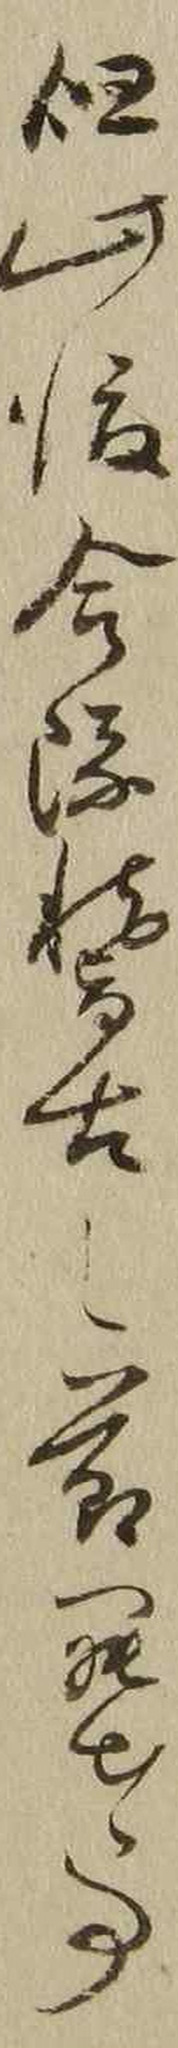但此後合隊稽古之節罷出候事
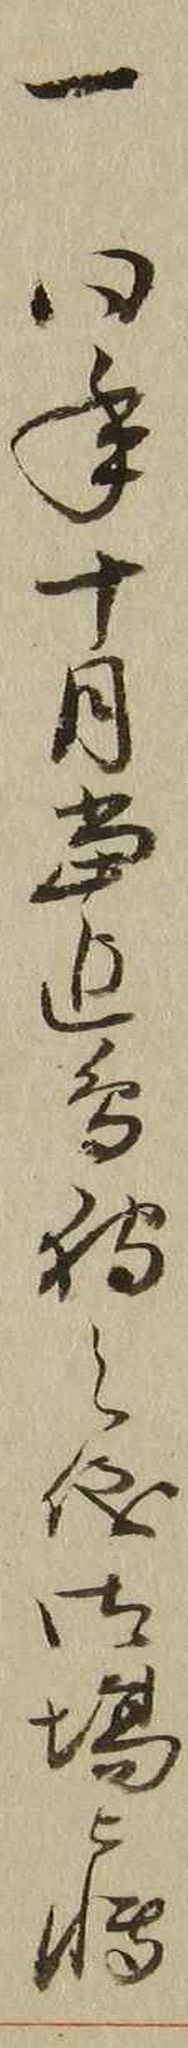一同年十月当追鳥狩之儀御場被転
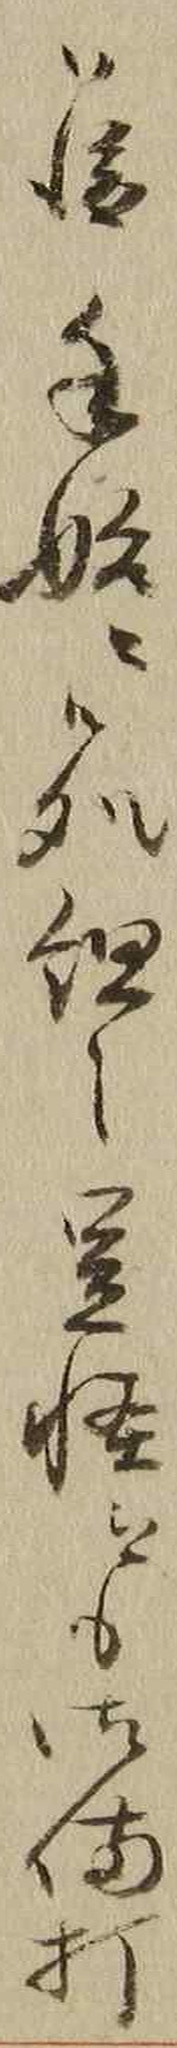候後手始ニ候処組之足軽とも御備打
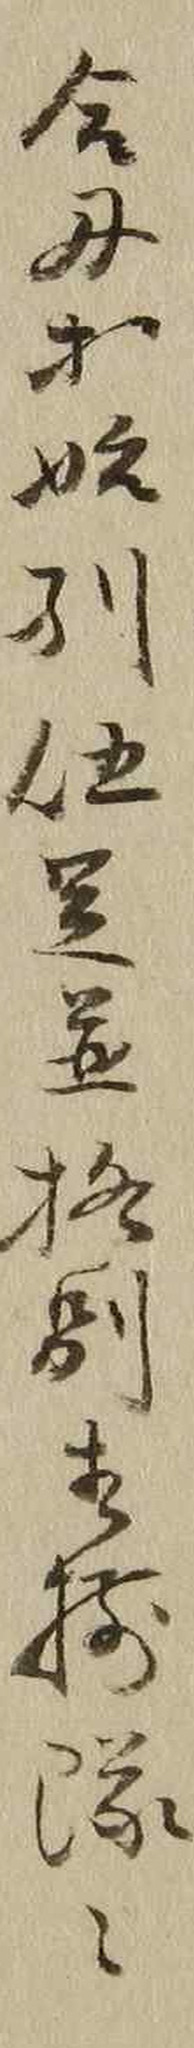合丹等始列伍足並格別相揃隊々
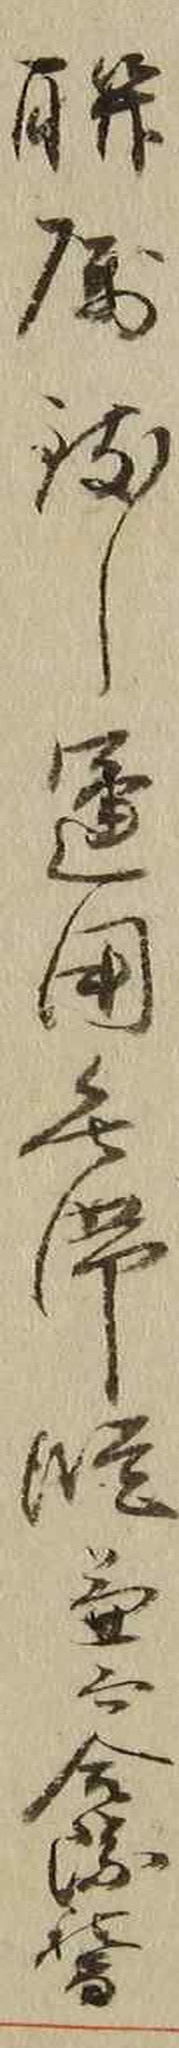聯属致し運用無滞段兼而合隊稽
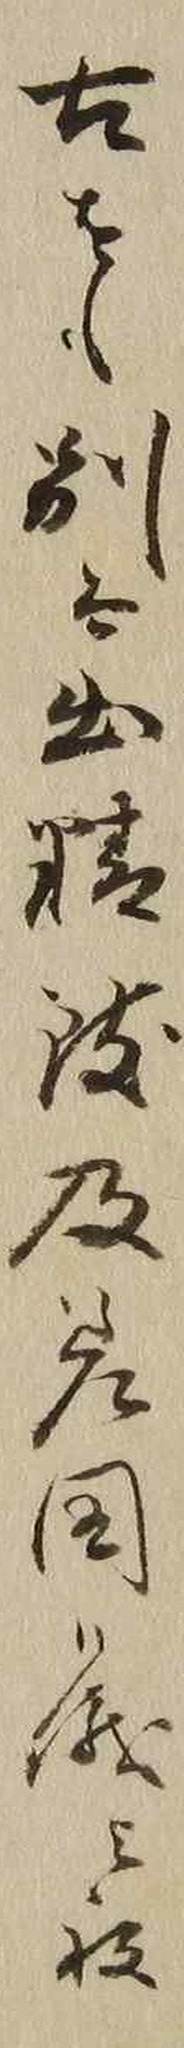古をも別而出精致及差図候儀与被
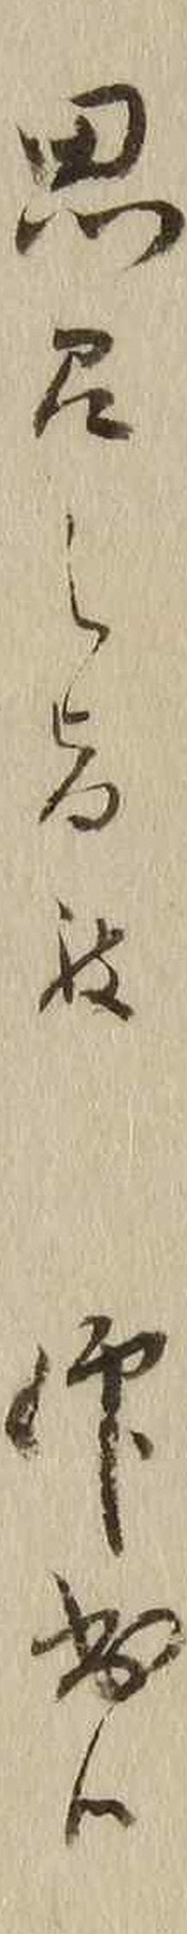思召之旨被仰出候
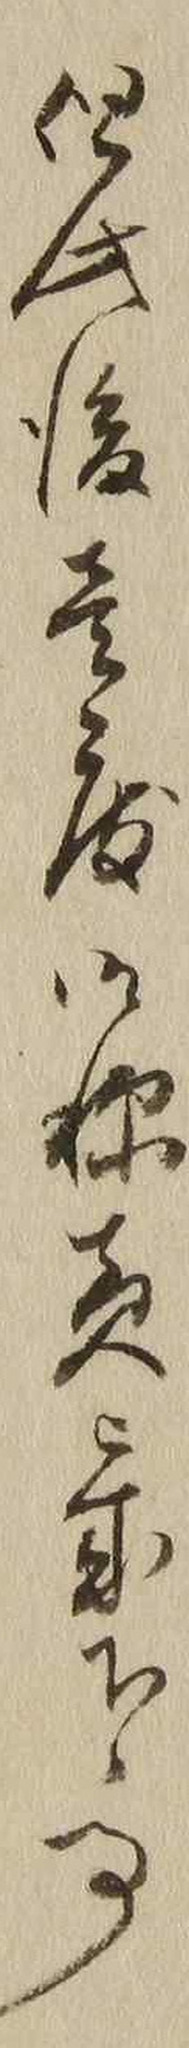但此後壱度御称美被成下候事

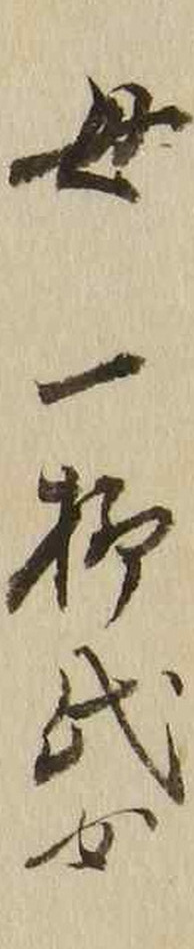母一柳氏女
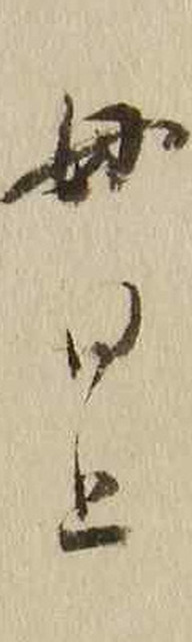母同上
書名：諸士系譜　巻之225　ま之部6
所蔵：会津若松市立会津図書館
